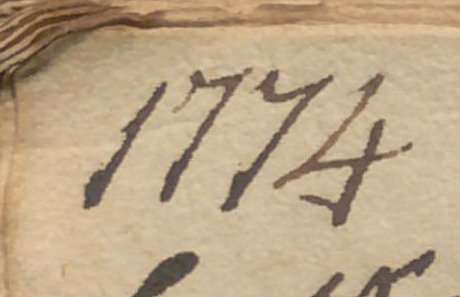1774
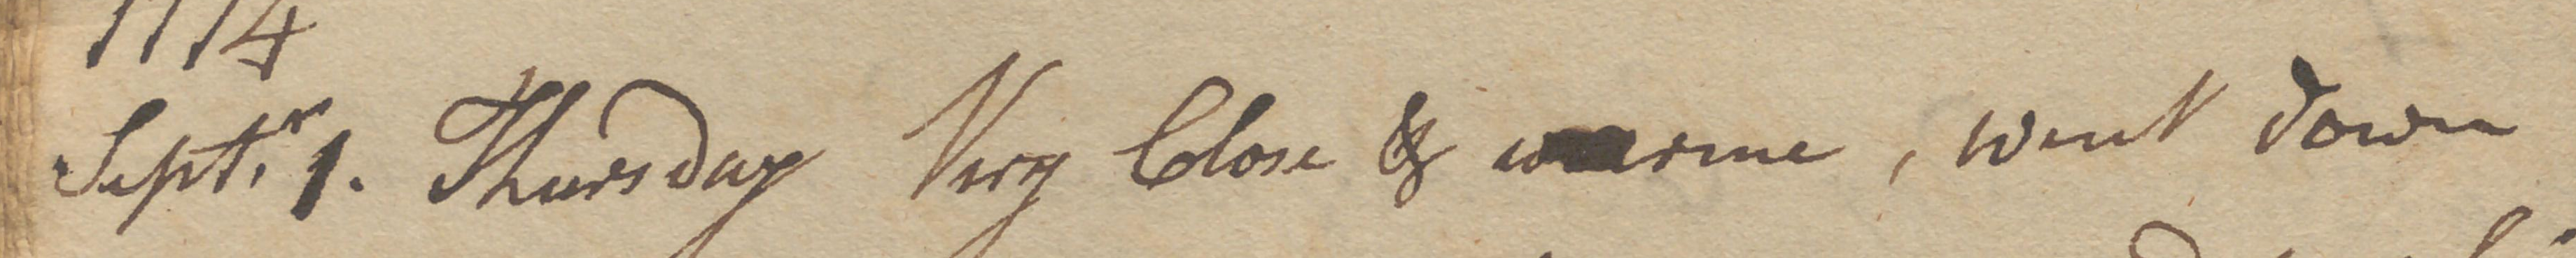Sept^r. 9. Thursday Very Close & warme, went down
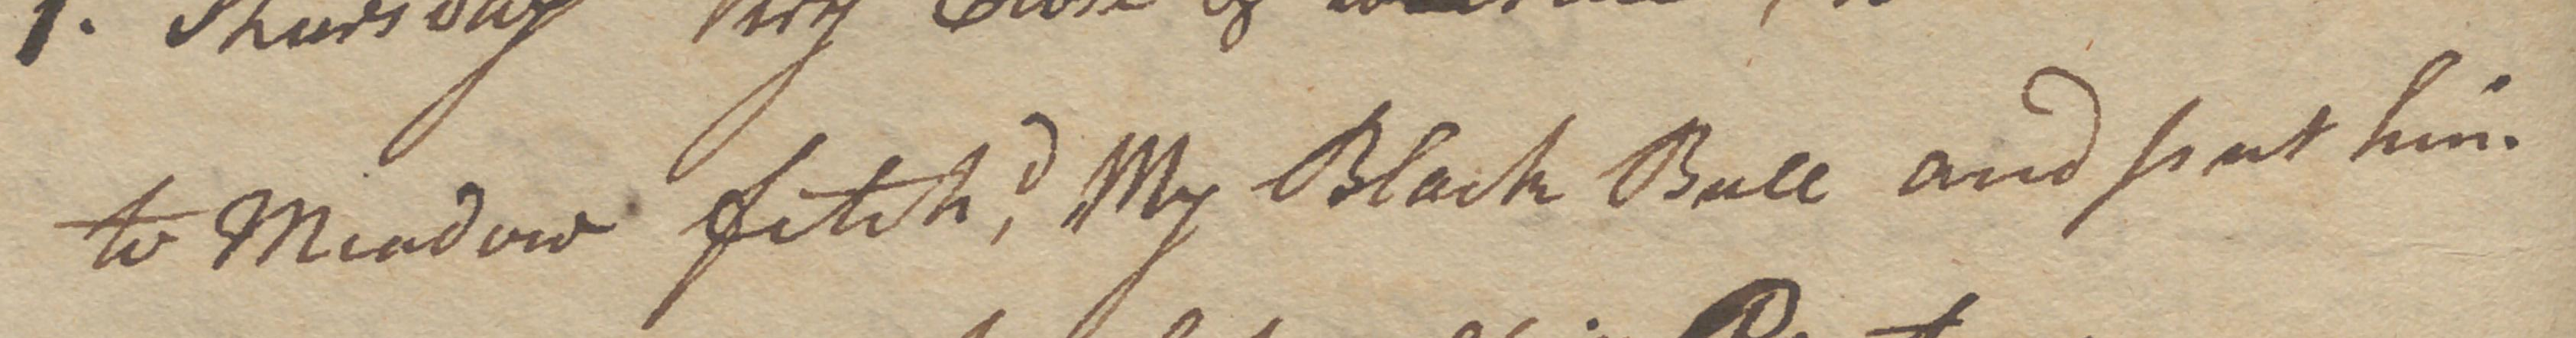to Meadow fetch^d. My Black Bull and put him
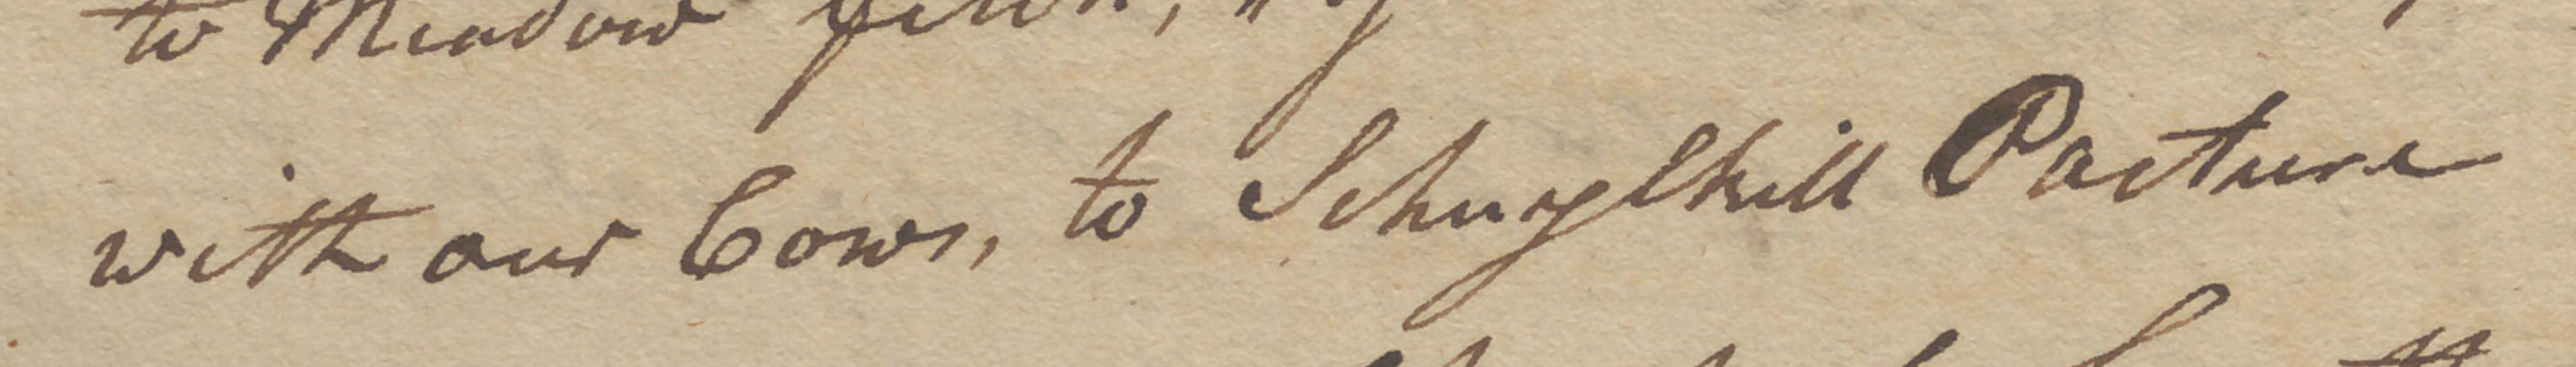with our Cows, to Schuylkill Pasture
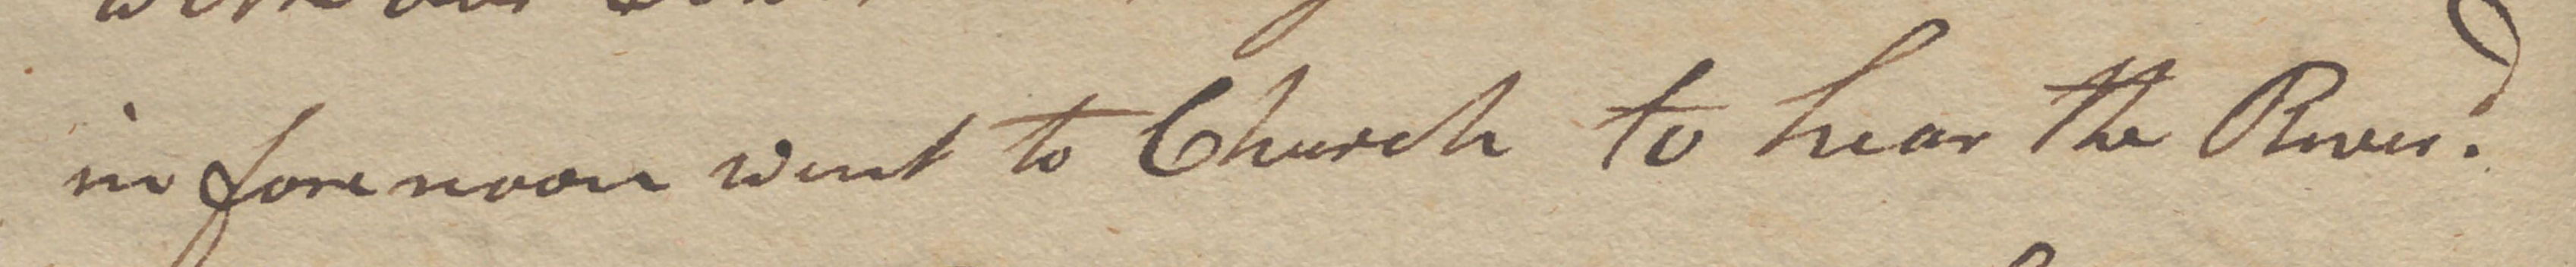in forenoon went to Church to hear the Rever^d.
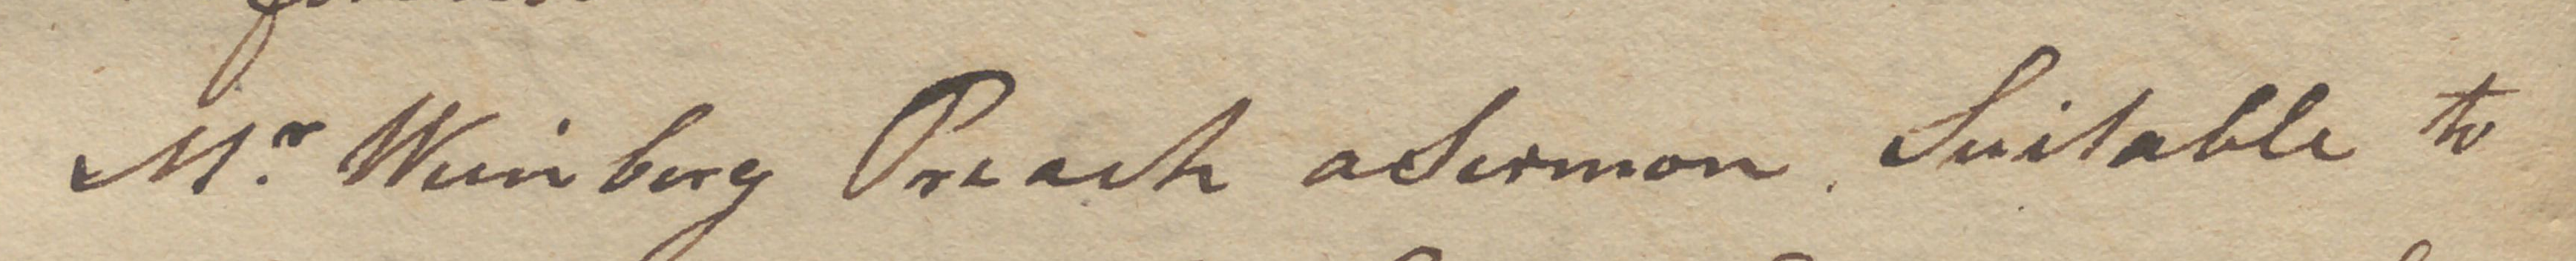M^r. Weinberg Preach a Sermon Suitable to
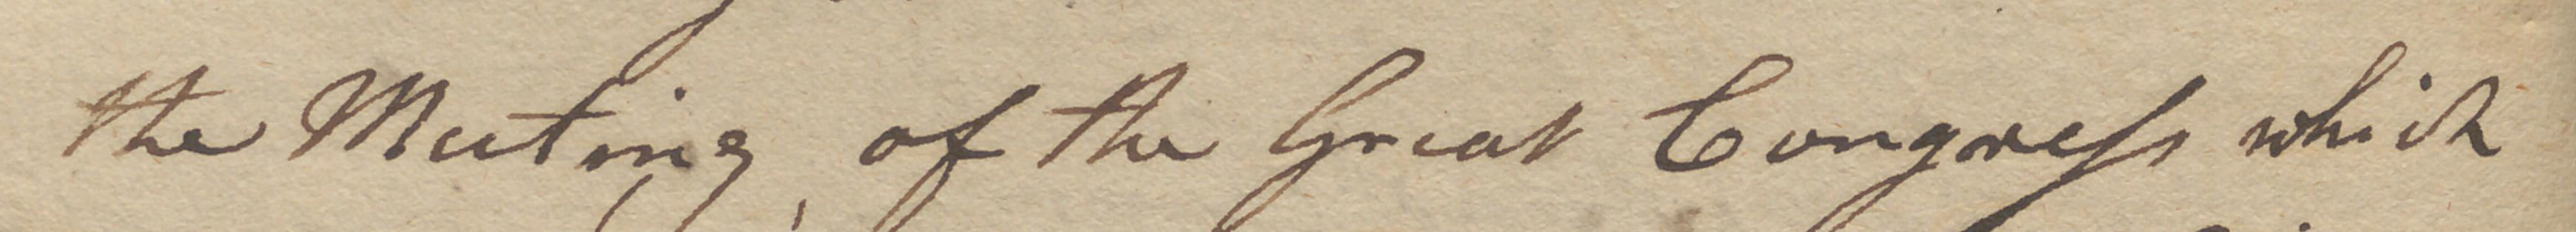the Meeting of the Great Congress which
